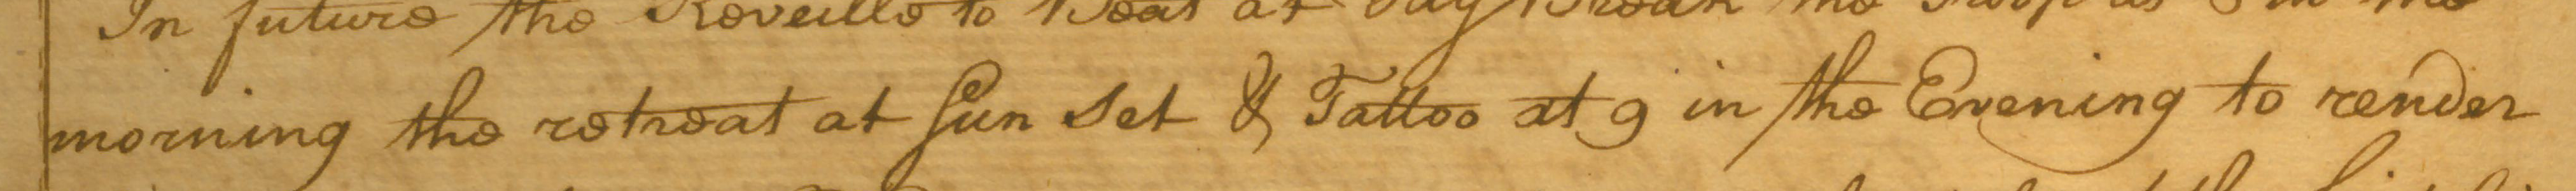morning the retreat at sun set & Tattoo at 9 in the Evening to render
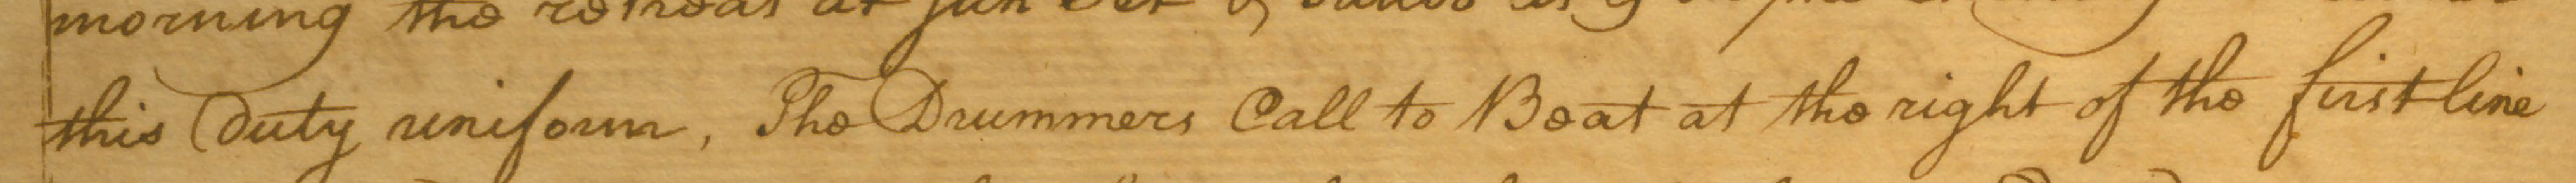this duty uniform. The Drummers call to Beat at the right of the first line
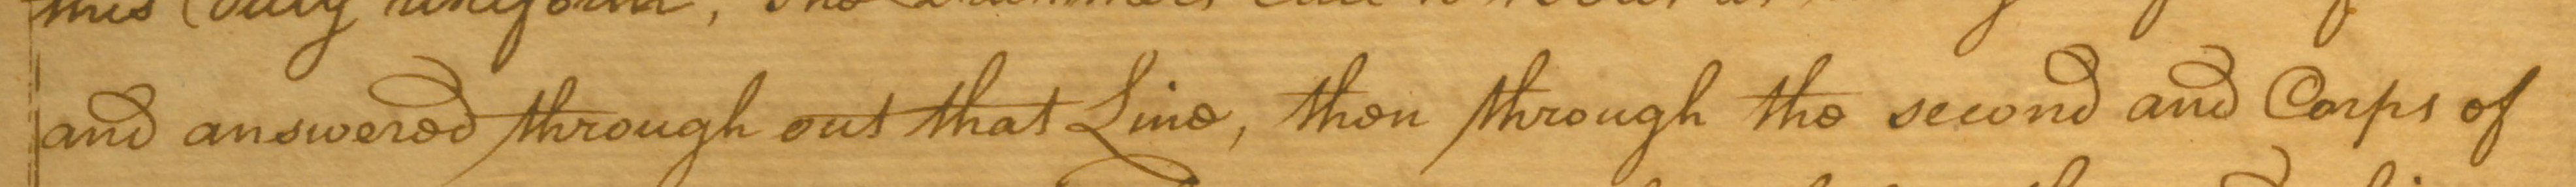and answered through out that Line, then through the second and Corps of
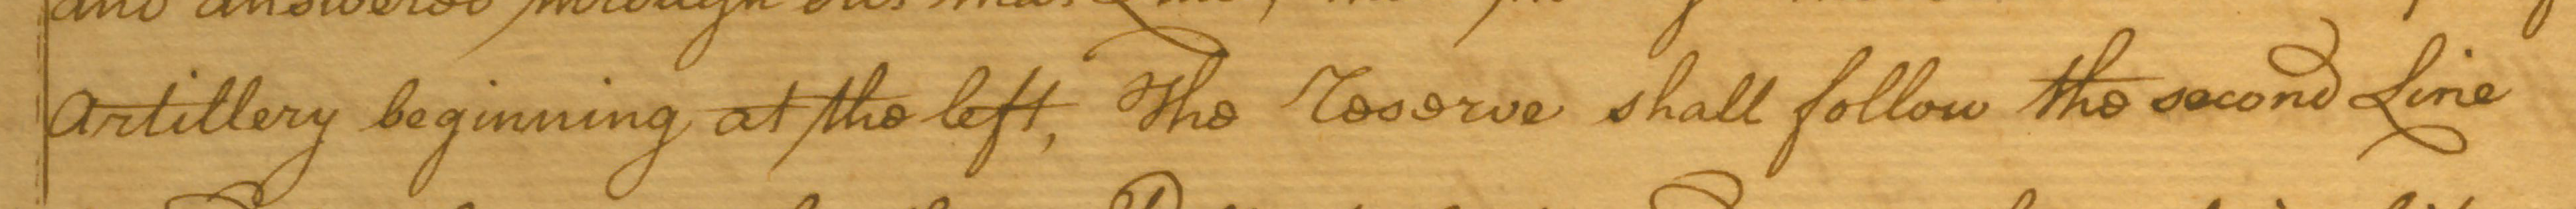Artillery beginning at the left, The reserve shall follow the second Line
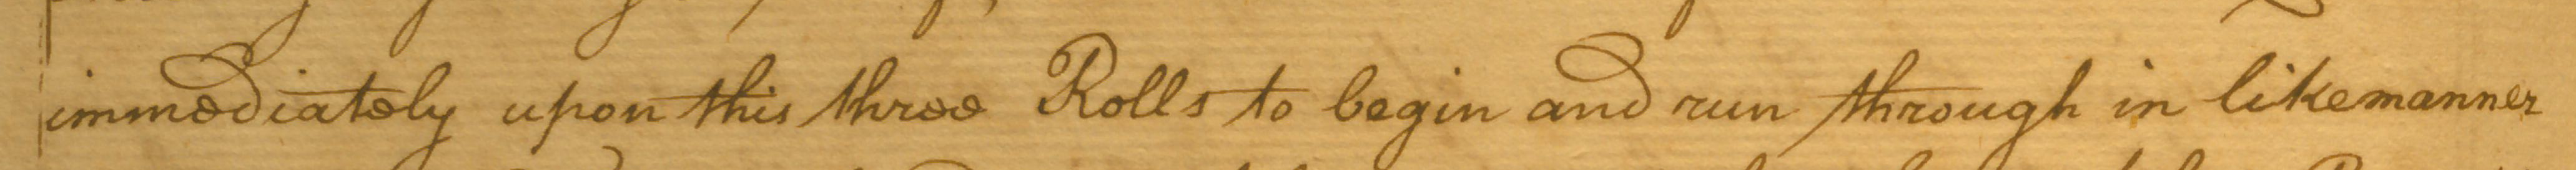immediately upon this three Rolls to begin and run through in like manner
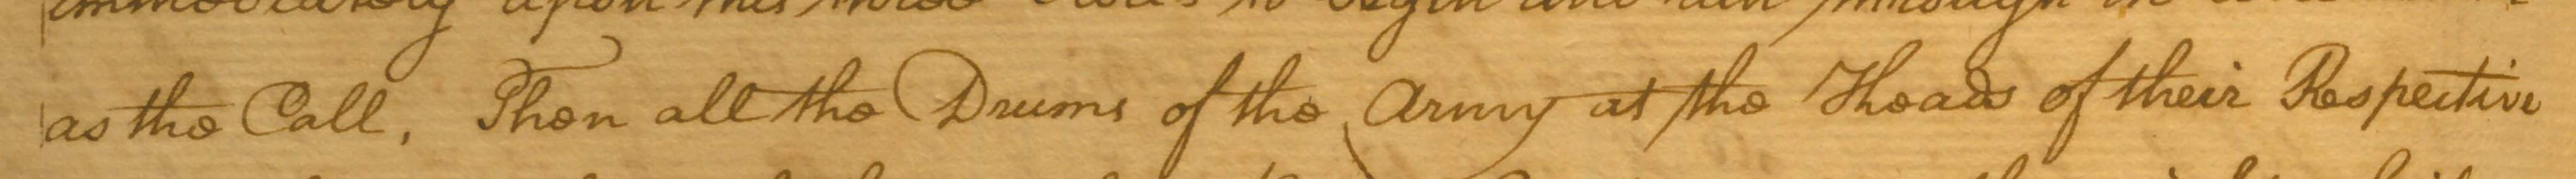as the Call. Then all the Drums of the Army at the Heads of their Respective
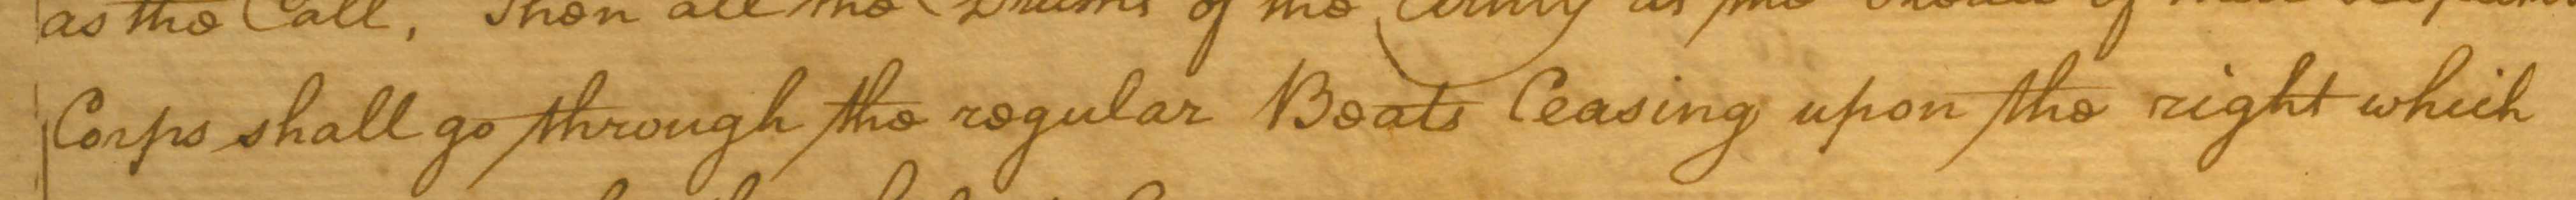Corps shall go through the regular Boats Ceasing upon the right which
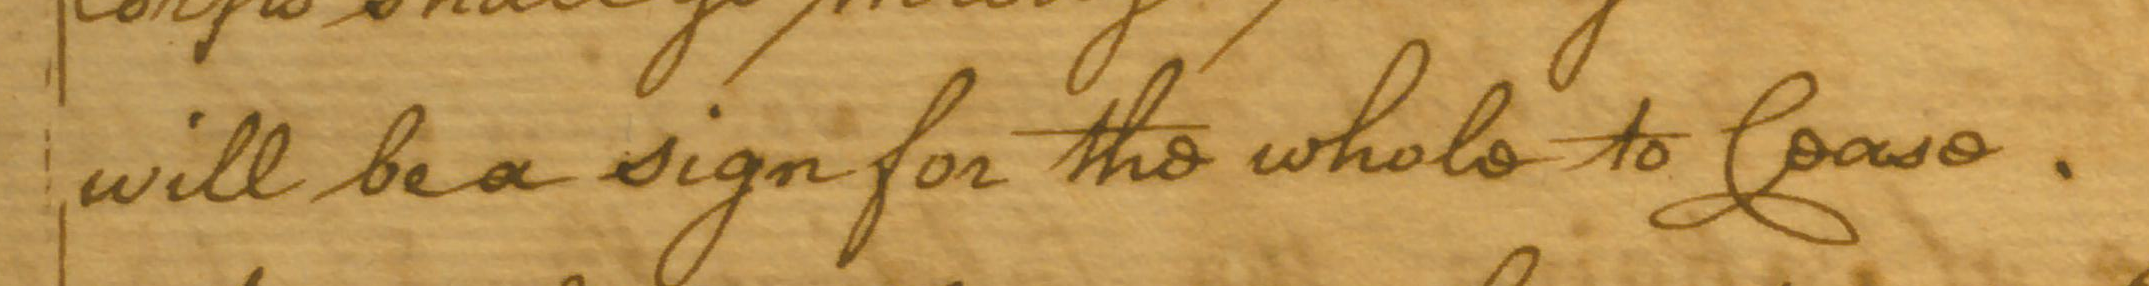will be a sign for the whole to Cease.
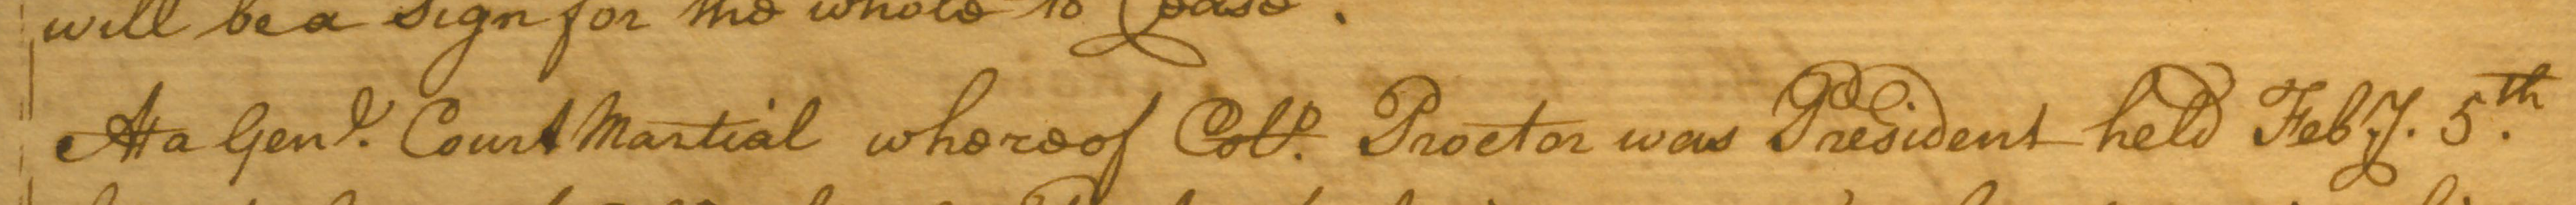At a Gen^l. Court Martial whereof Col^o. Proctor was President held Feb^y. 5^th.
